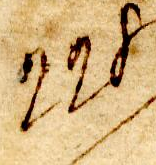228
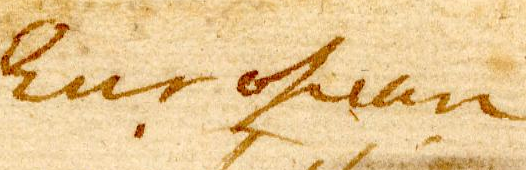Ever open
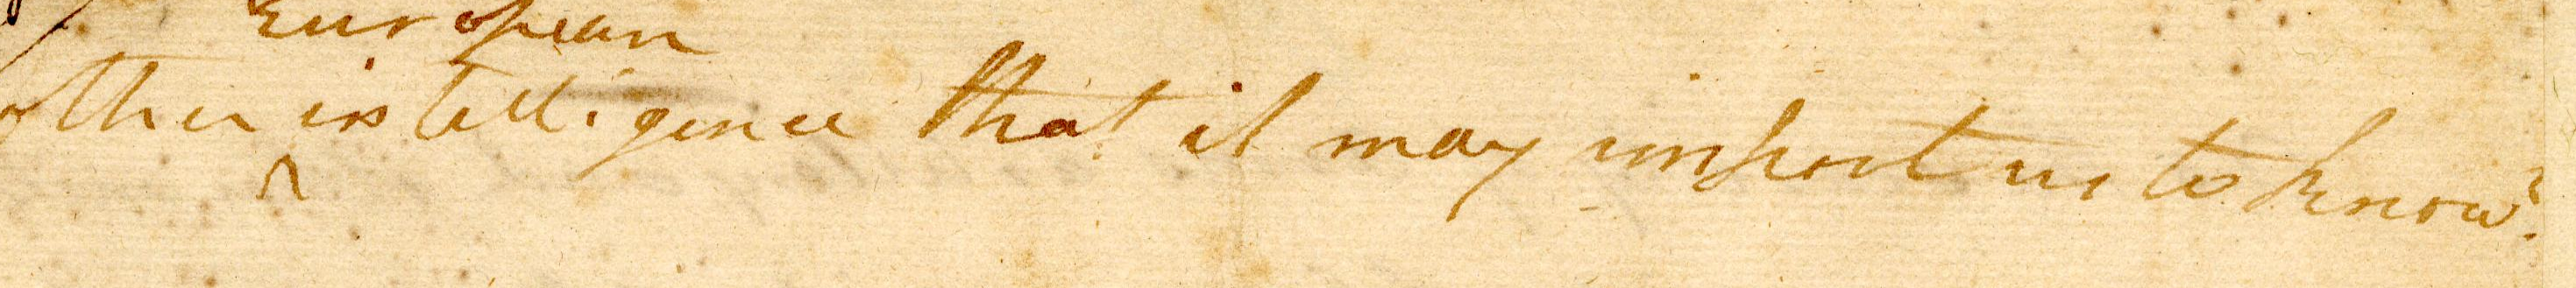other ^ is intelligence that it may import us to know?
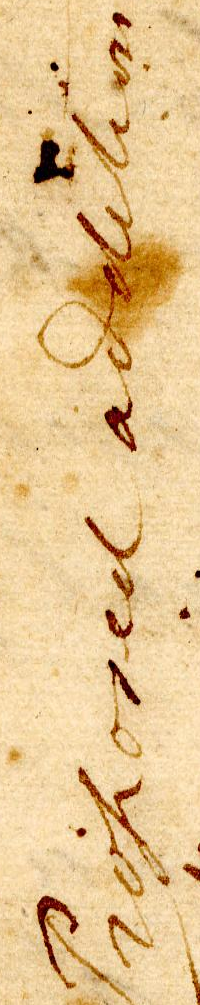Proposed addition
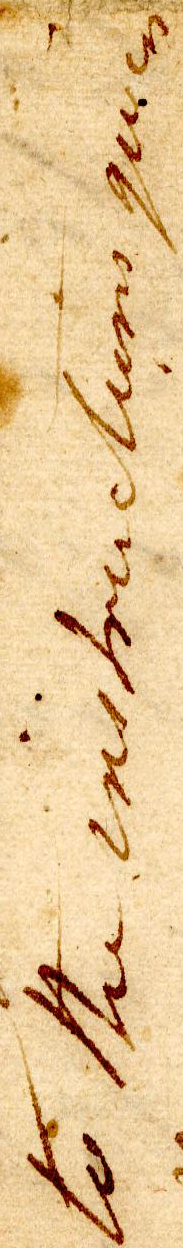to the instructions given
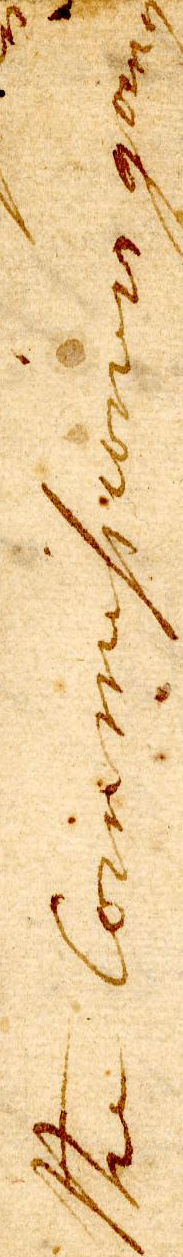the Commissioners going
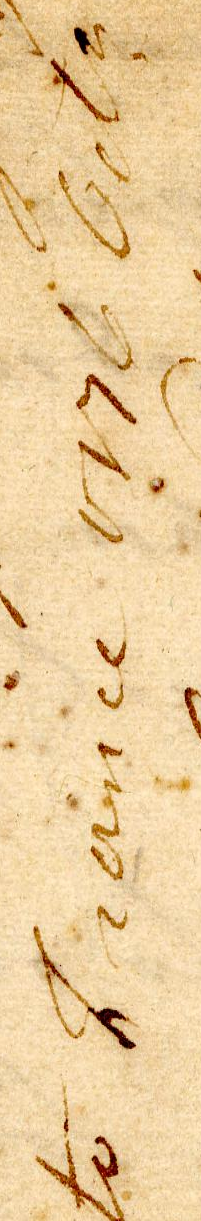to France 1776 Oct^r.
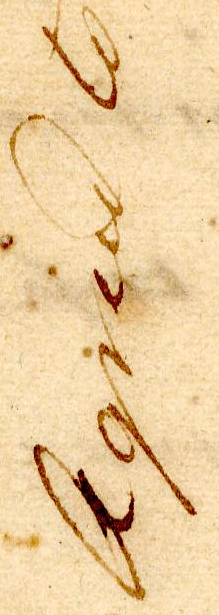Agreed to
